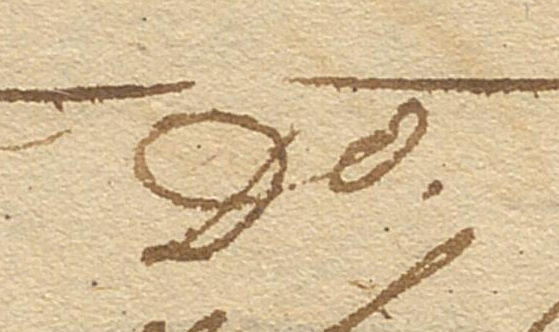D^o.
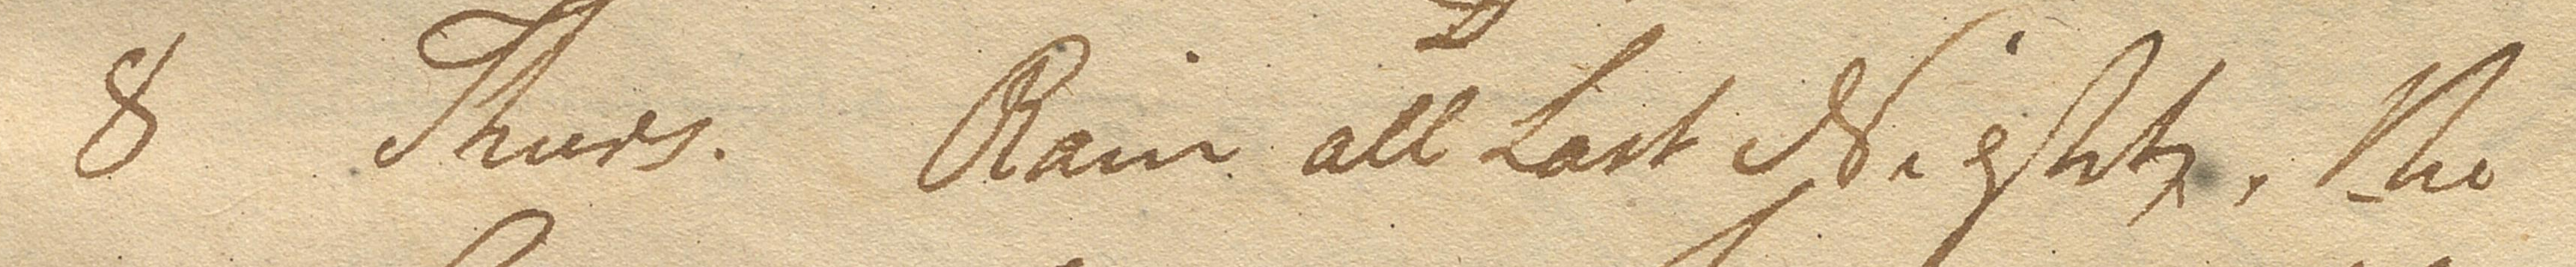8 Thurs. Rain all Last Night, the
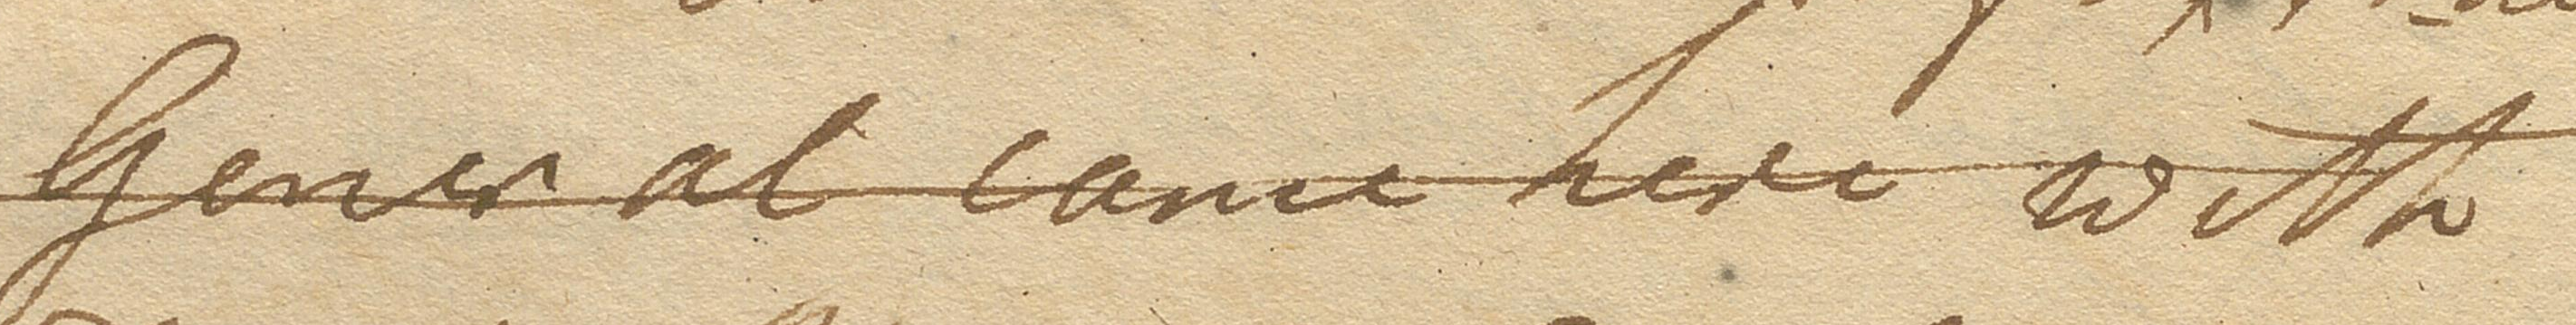Gener al came here with
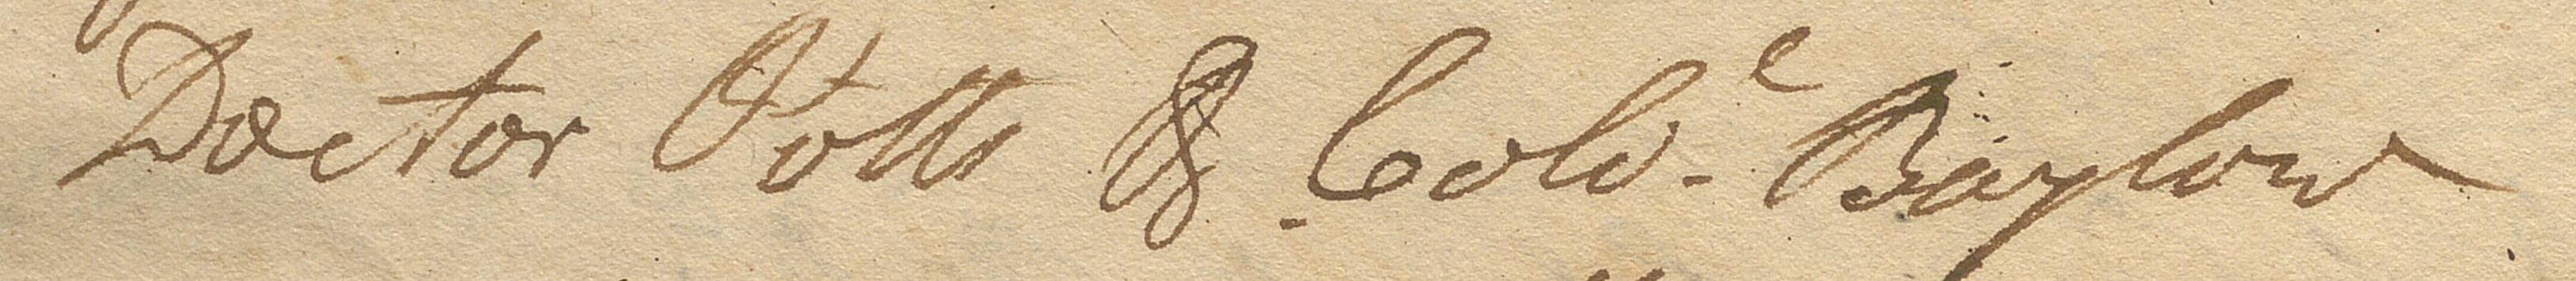Doctor Potts & Colo^l. Baylow
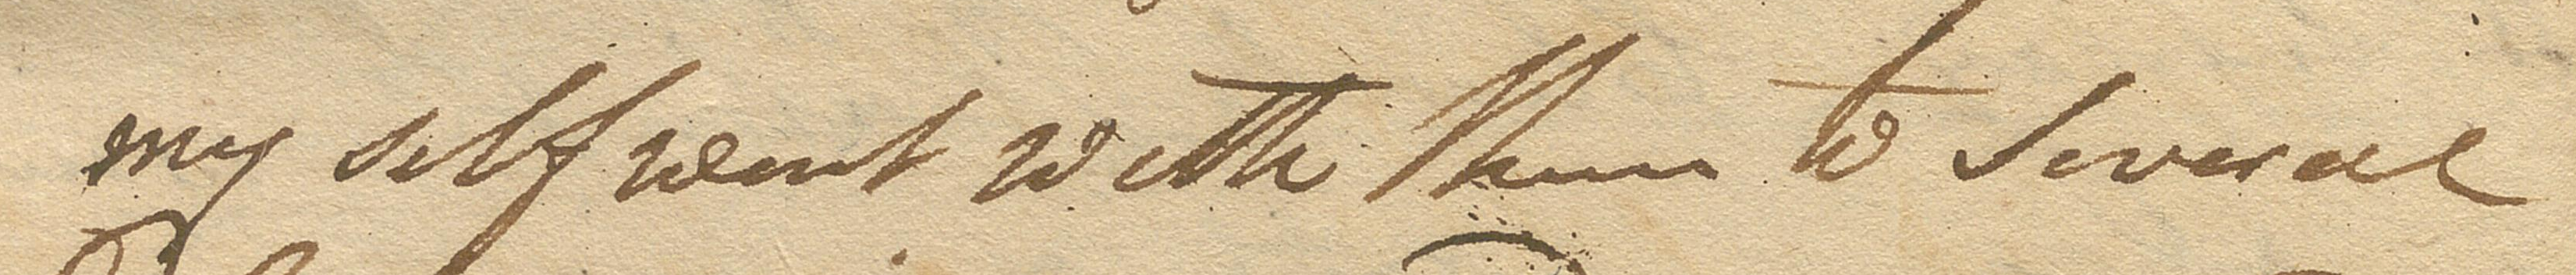my self went with them to Several
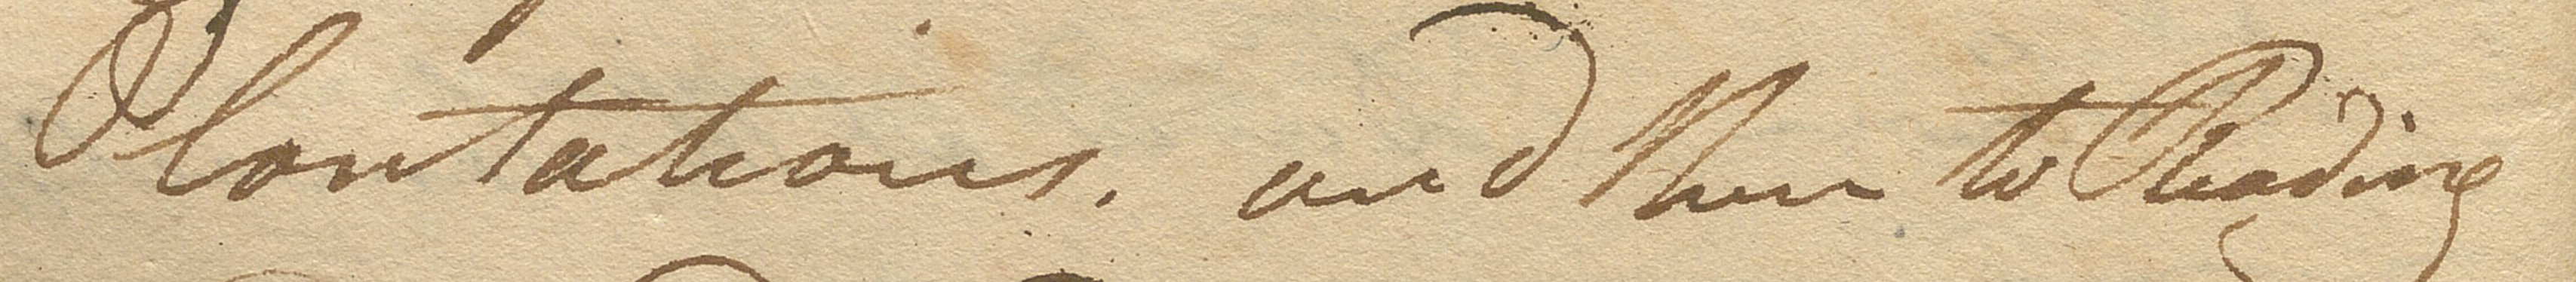Plantations, and there to Reading
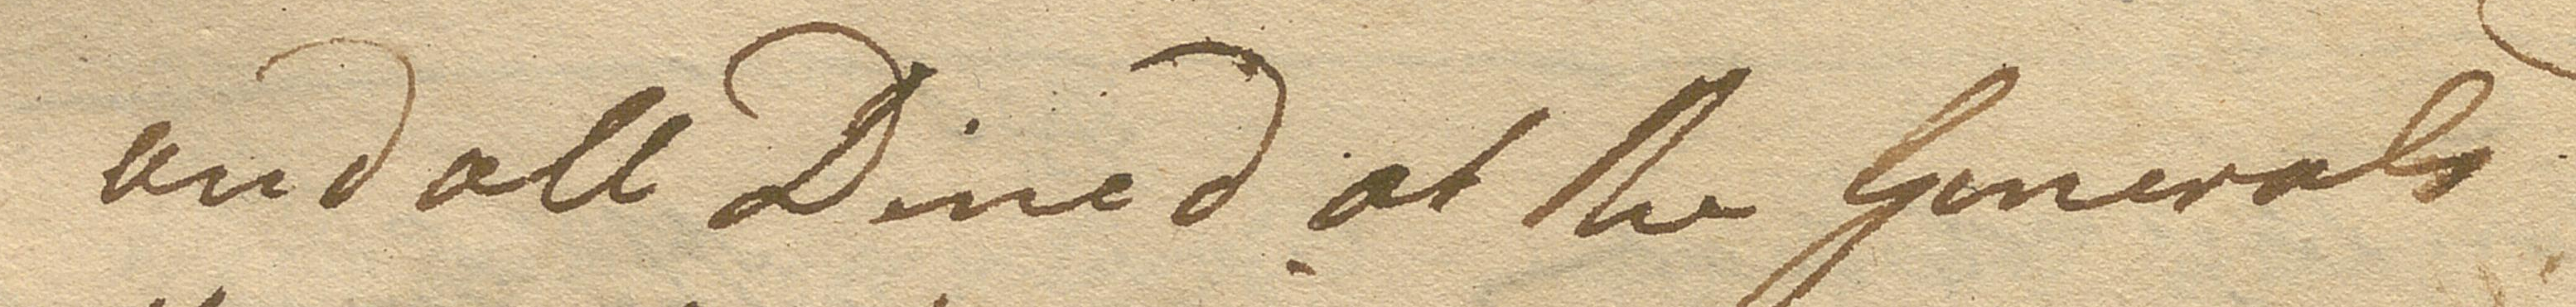and all Dined at the Generals
